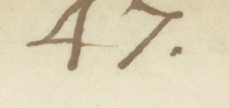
47.
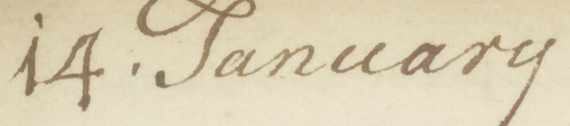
14. Januarij
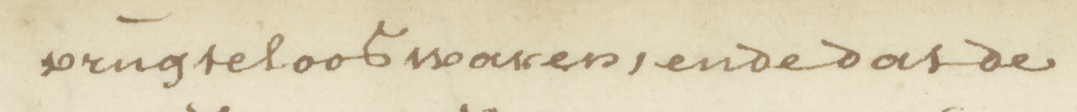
vrugteloos waren, ende dat de
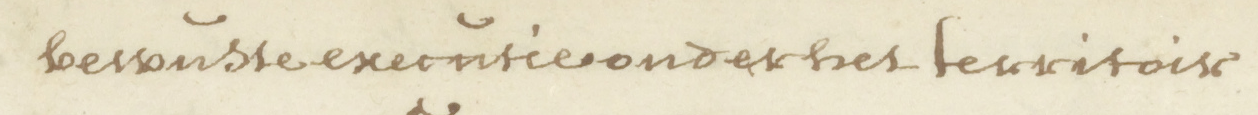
bewuste executie onder het territoir
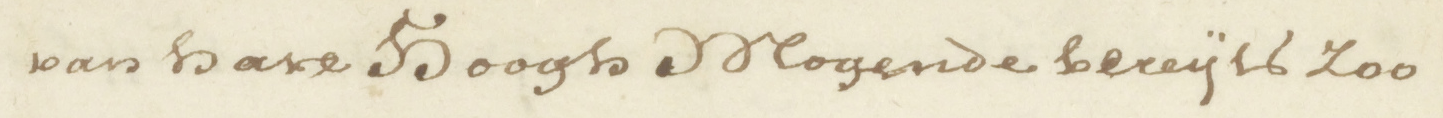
van hare Hoogh Mogende bereijts zoo
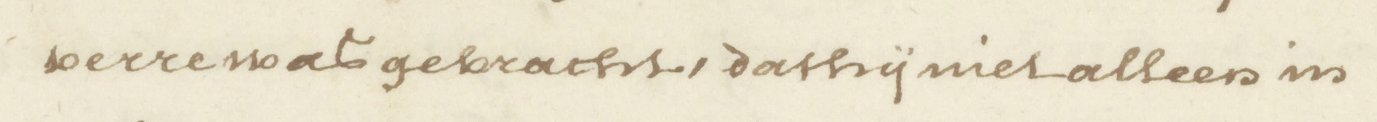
verre was gebracht, dat hij niet alleen in
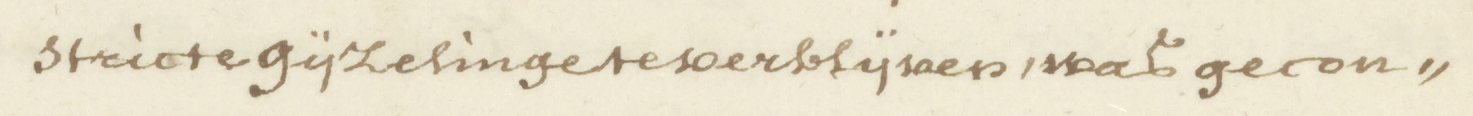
stricte gijzelinge te verblijven, was gecon„
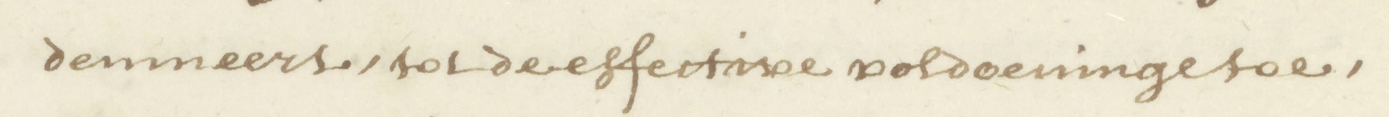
demneert, tot de effective voldoeninge toe,
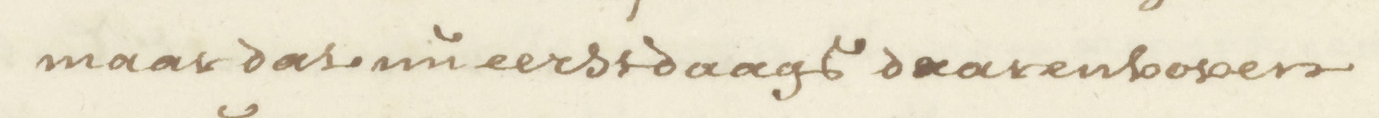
maar dat nu eerstdaags daaren boven
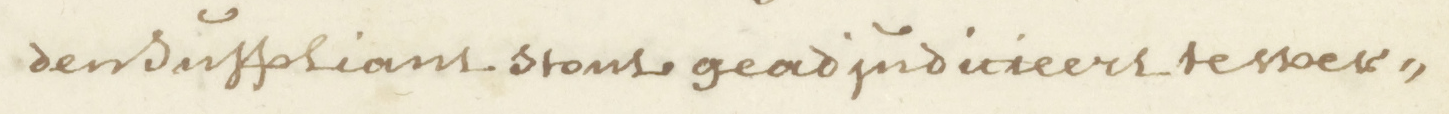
den suppliant stont geadjudicieert te wer„
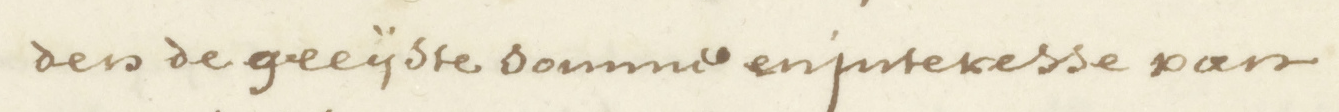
den de geeijste somme en interesse van
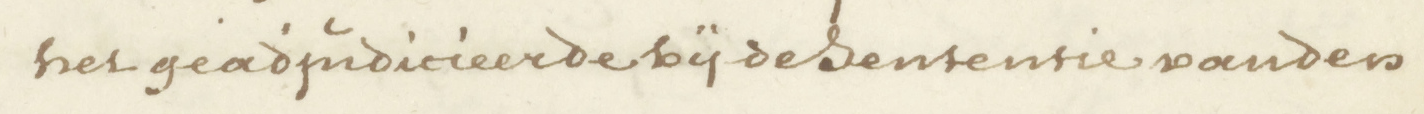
het geadjudicieerde bij de sententie vanden
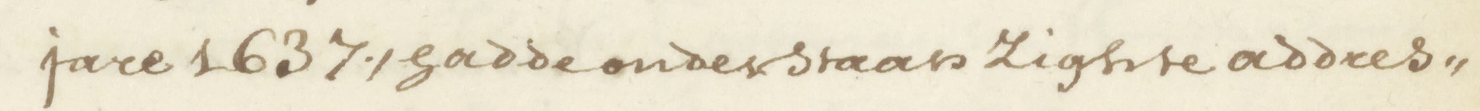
jare 1637, hadde onder staan zigh te addres„
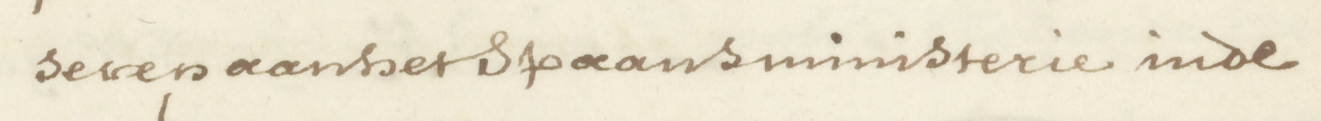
seren aan het spaans ministerie inde
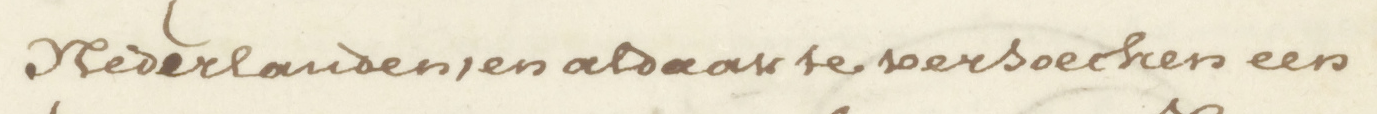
Nederlanden, en aldaar te versoecken een
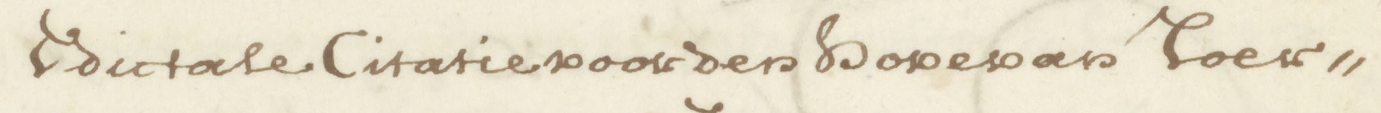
Edictale Citatie voor den Hove van Roer„
